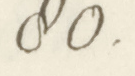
80.
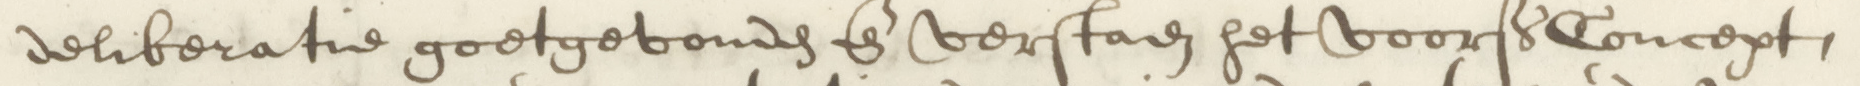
deliberatie goetgevonden & verstaen het voors Concept,
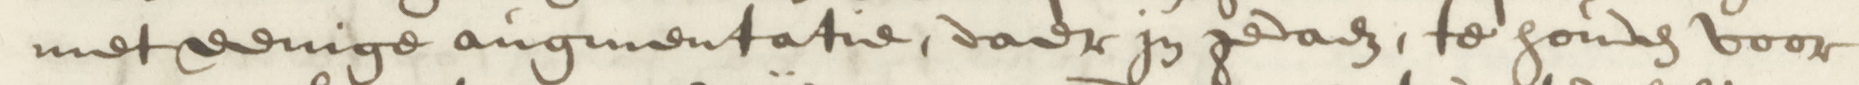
met eenige augmentatie, daer in gedaen, te houden voor
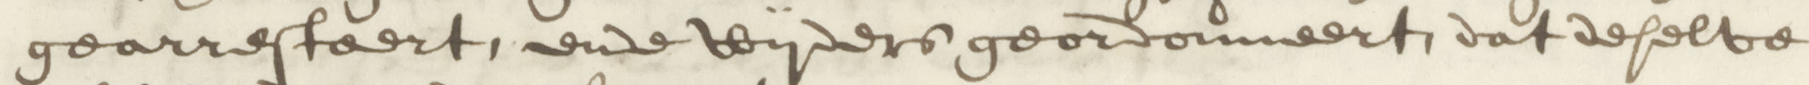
gearresteert, ende wijders geordonneert, dat deselve
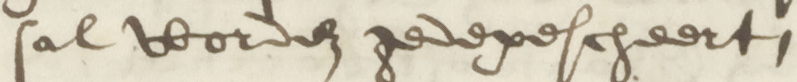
sal worden gedepescheert.
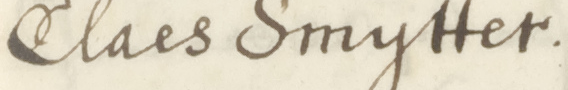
Claes Smijtter.
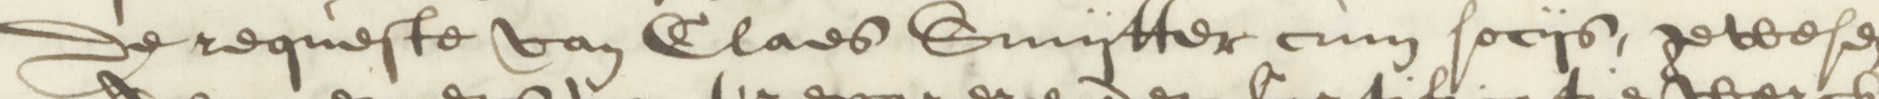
De requeste van Claes Smijtter cum socijs, gewesen
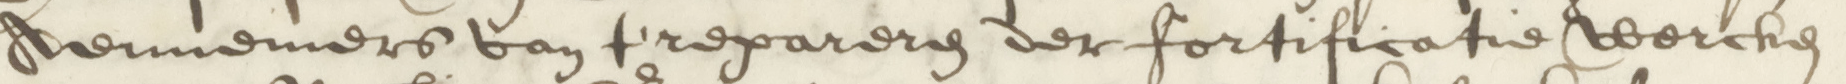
Aenemers van t'repareren der fortificatie wercken
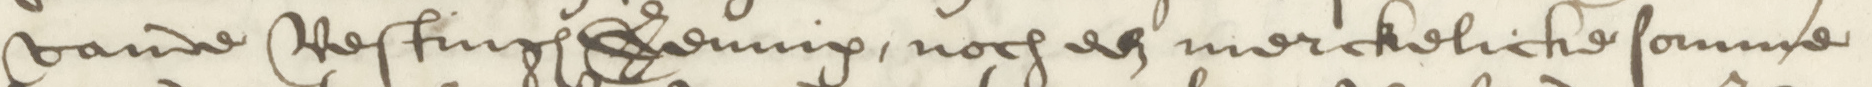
vande Vestingh Gennep, noch een merckelicke somme
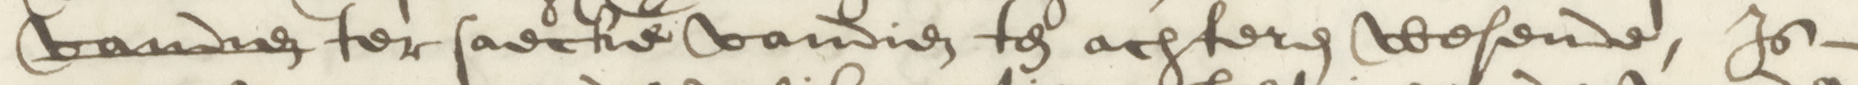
vandien ter saecke vandien ten achteren wesende, Is —
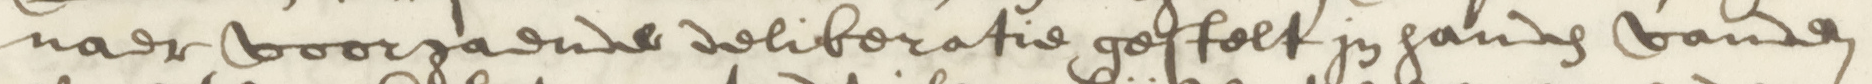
naer voorgaende deliberatie gestelt in handen vanden
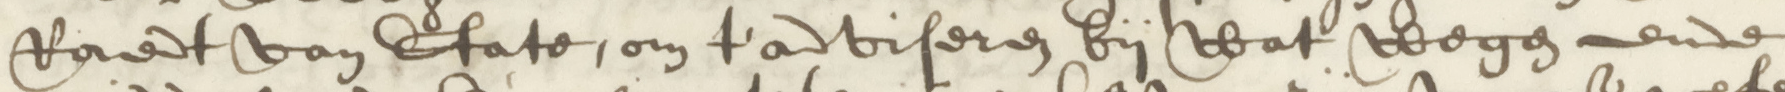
Raedt van State, om t'adviseren bij wat wegen ende
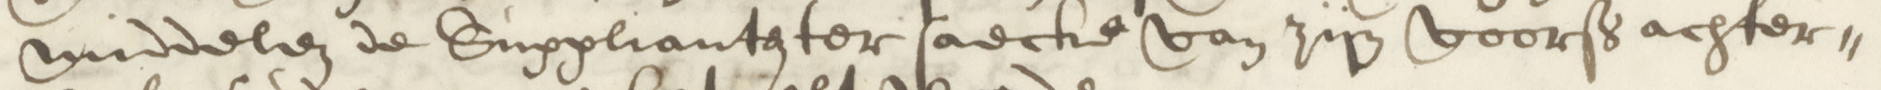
middelen de Supplianten ter saecke van zijn voors achter„
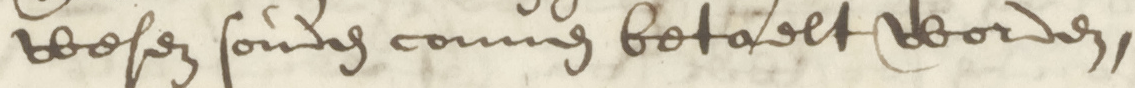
wesen souden connen betaelt worden.
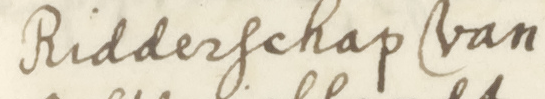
Ridderschap van
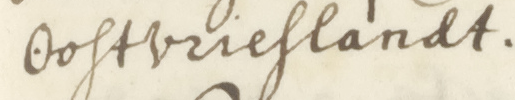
Oostvrieslandt.
